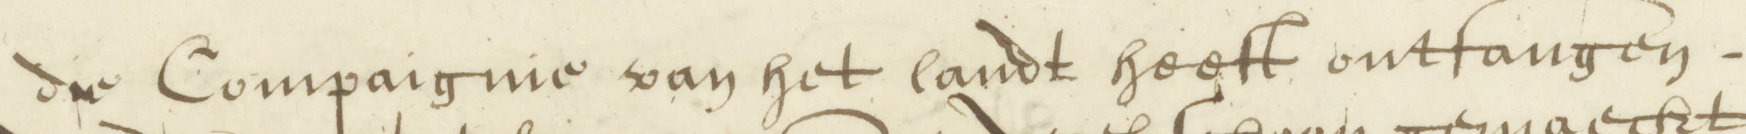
die Compaignie van het landt heeft ontfangen
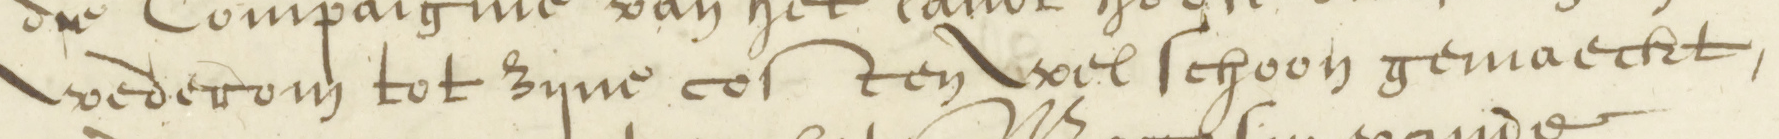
wederom tot zyne costen wel schoon gemaeckt,
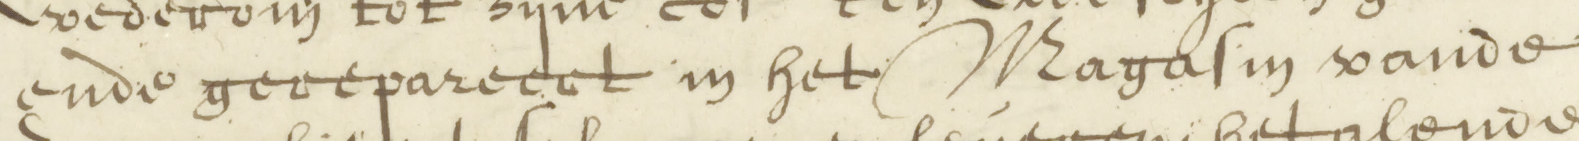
ende gerepareert in het Magasin vande
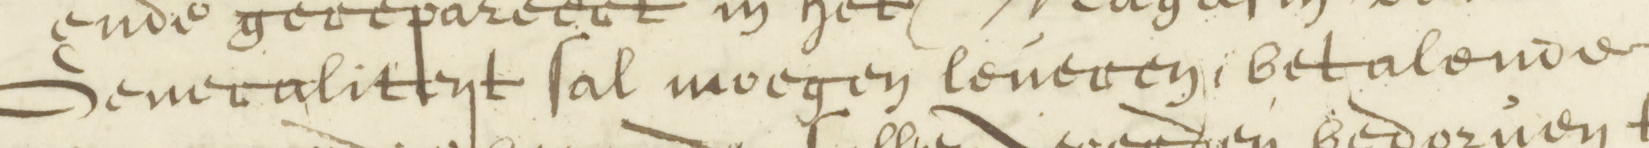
Generaliteyt sal moegen leueren, betalende
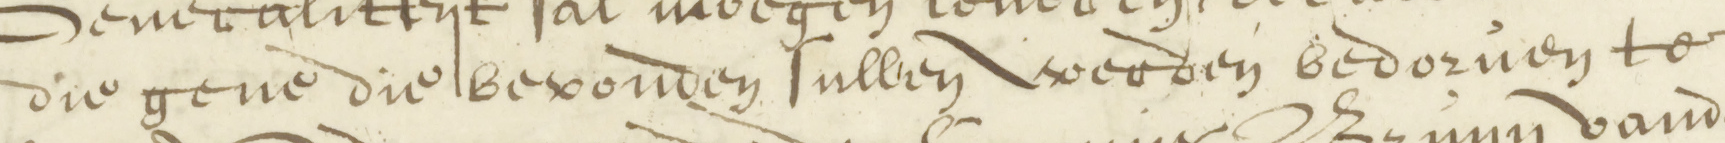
die gene die bevonden sullen werden bedoruen te
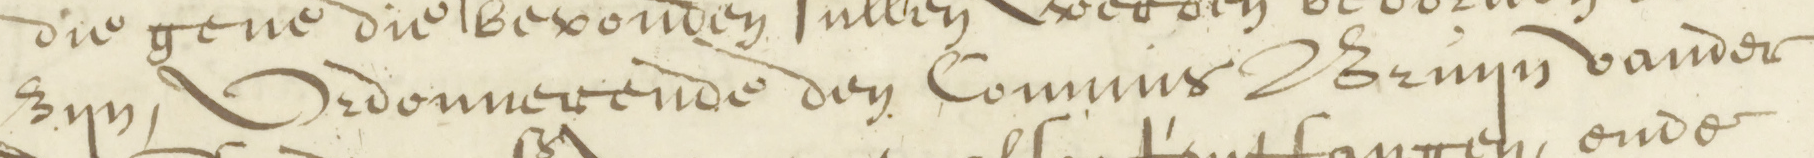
zyn, Ordonnerende den Commis Bruyn vander
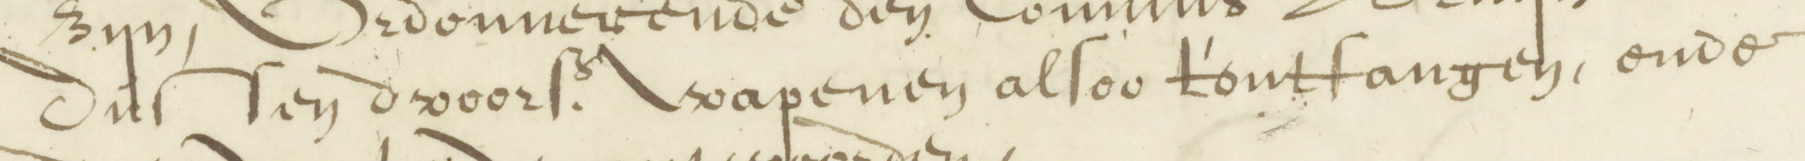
Dussen d voors. wapenen alsoo t'ontfangen, ende
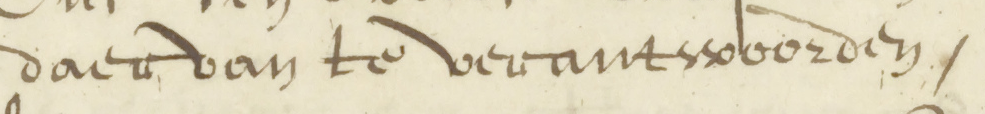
daervan te verantwoorden.
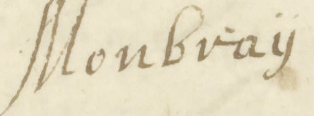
Monbraij
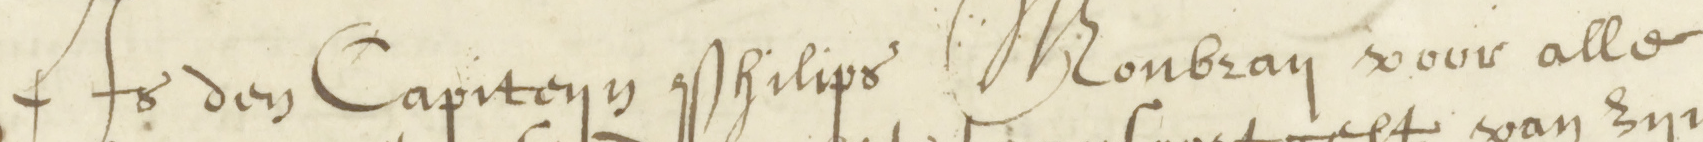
Is den Capiteyn Philips Mounray voor alle
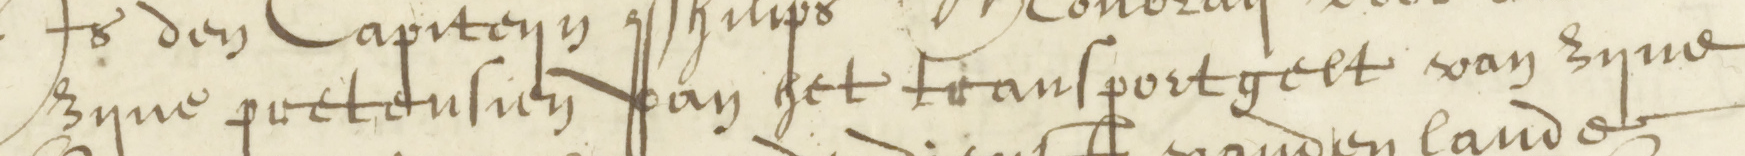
zyne pretensien van het transportgelt van zyne
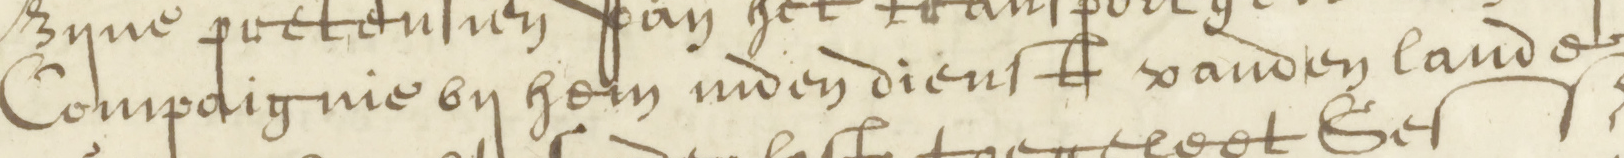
Compaignie by hem inden dienst vanden lande
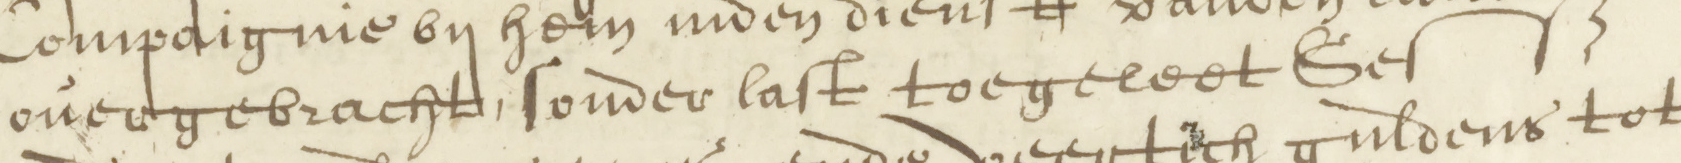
ouergebracht, sonder last toegeleet Sess
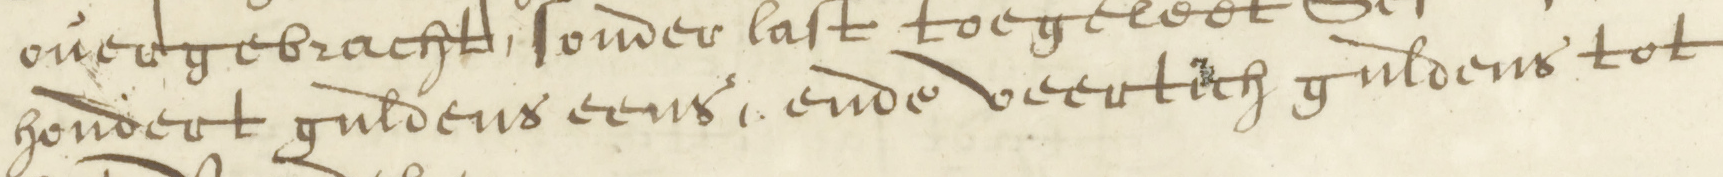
hondert guldens eens, ende veertich guldens tot
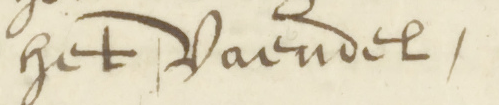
het Vaendel.
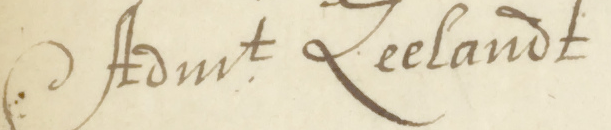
Admt. Zeelandt
